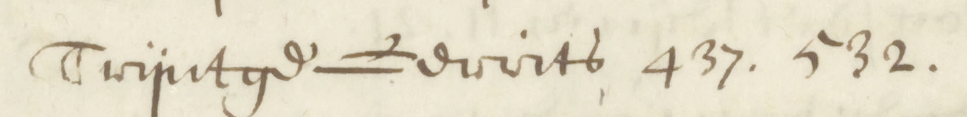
Trijntge Gerrits 437. 532.
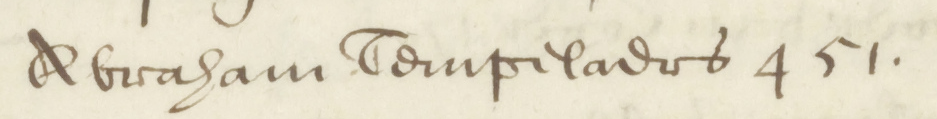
Abraham Tempelaers 451.
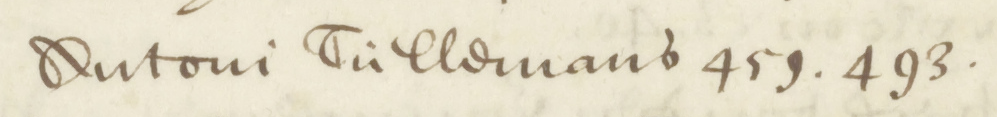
Antoni Tiellemans 459. 493.
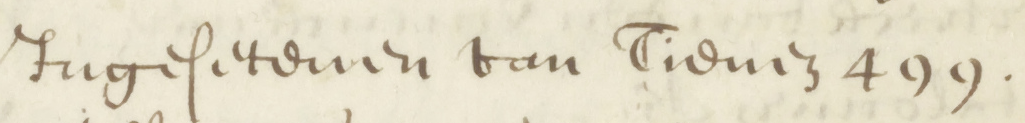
Ingesetenen van Tienen 499.
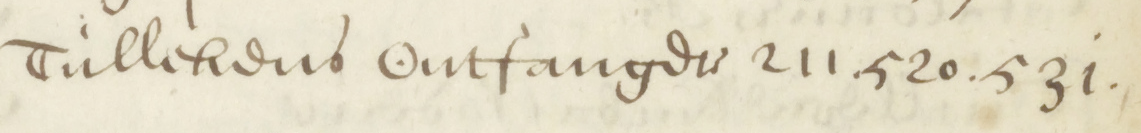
Tullekens Ontfanger 211. 520. 531.
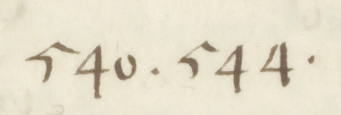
540. 544.
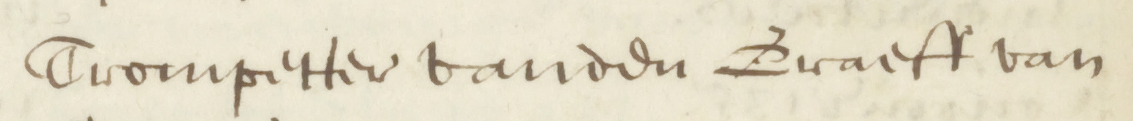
Trompetter vanden Graeff van
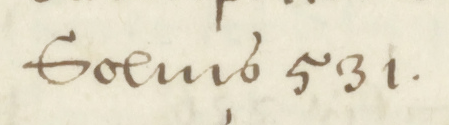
Solms 531.
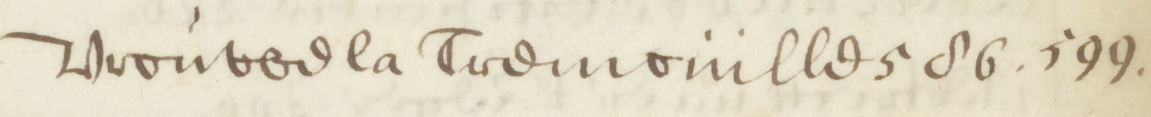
Vrouwe la Tremouille 586. 599.
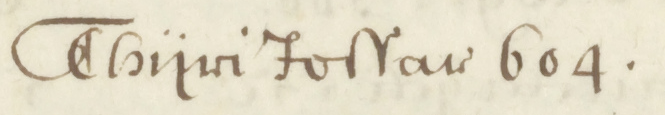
Thijri Jossar 604.
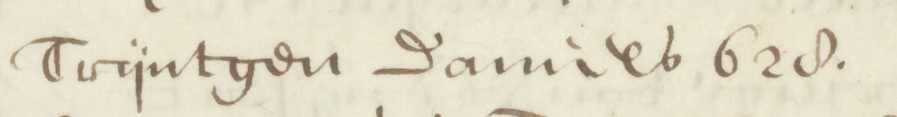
Trijntgen Daniels 628.
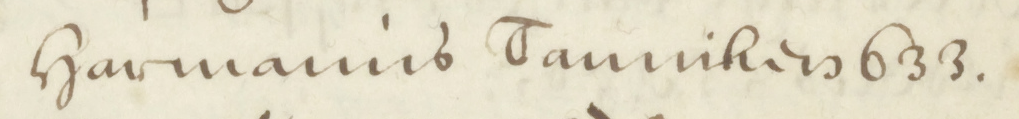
Harmanus Tanniken 633.
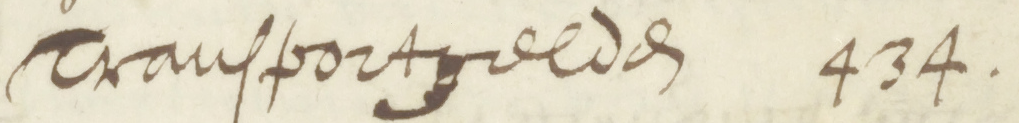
Transportgelden 434.
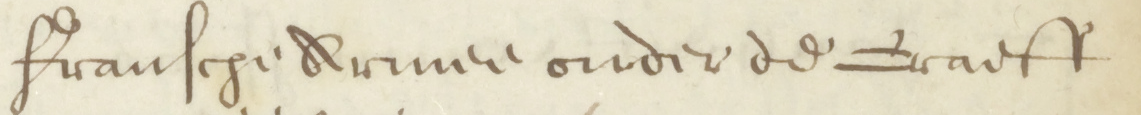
Fransche Armee onder de Graeff
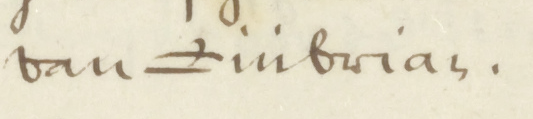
van Guibrian.
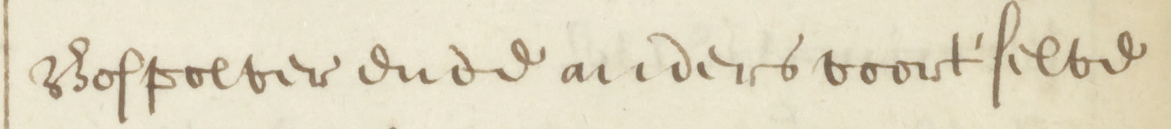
Bospolver ende anders voort‛selve
